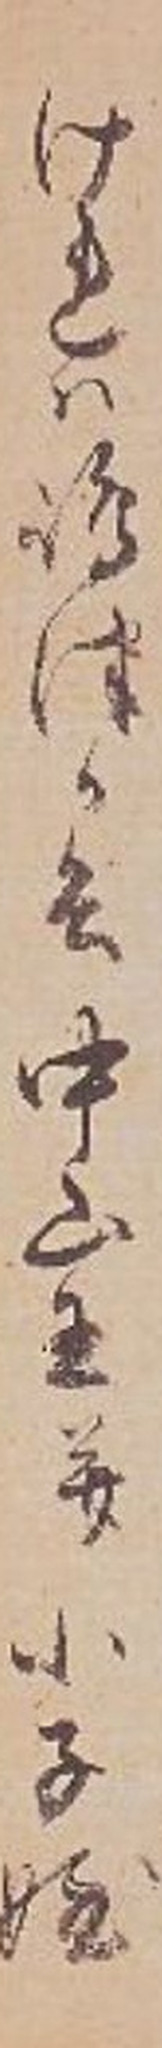けれハ嶋津か兵中山王幷小子姫
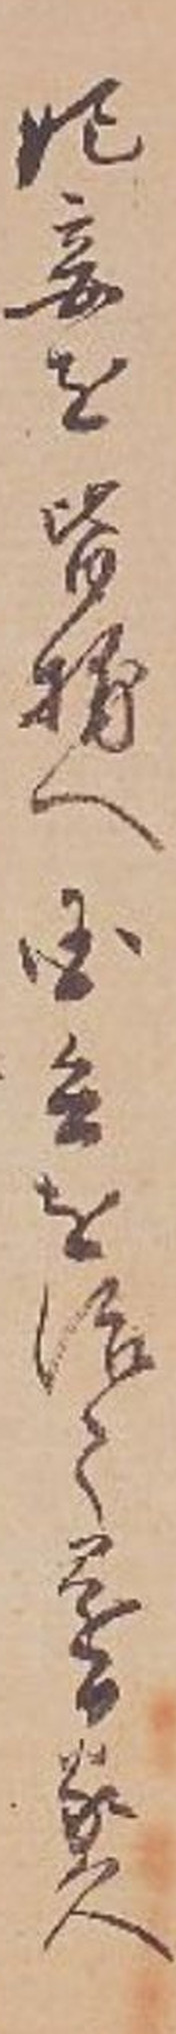妃妾を皆捕へ国兵を治て懸る家久
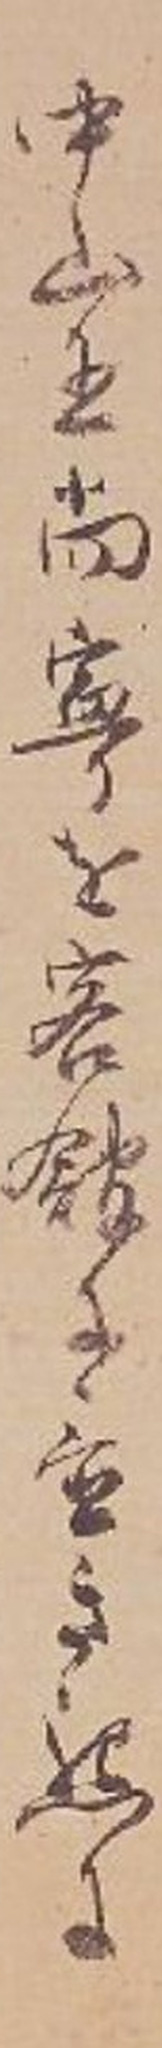中山王尚寧を客館に置き懇に
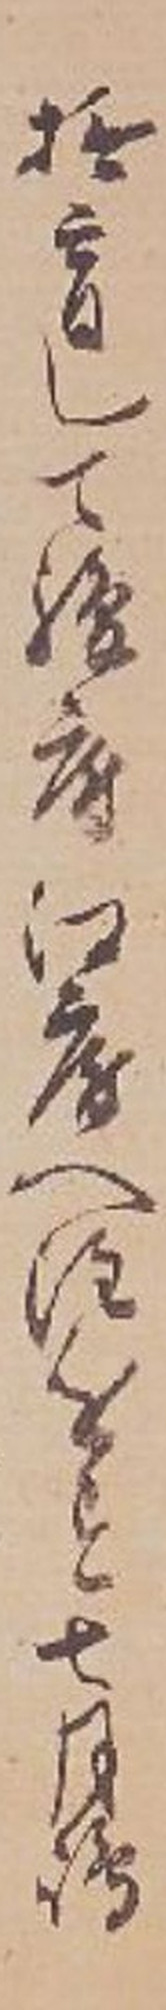撫育して駿府江府へ注進す七月嶋
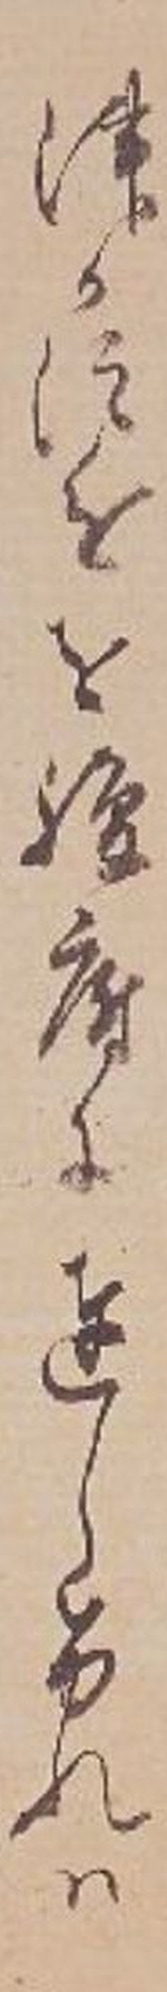津か注進を駿府に達しけれハ
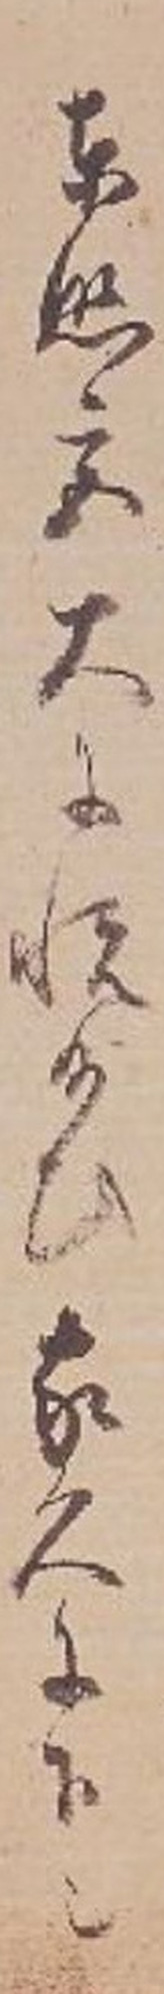東照宮大に悦給ひ家久に下シ
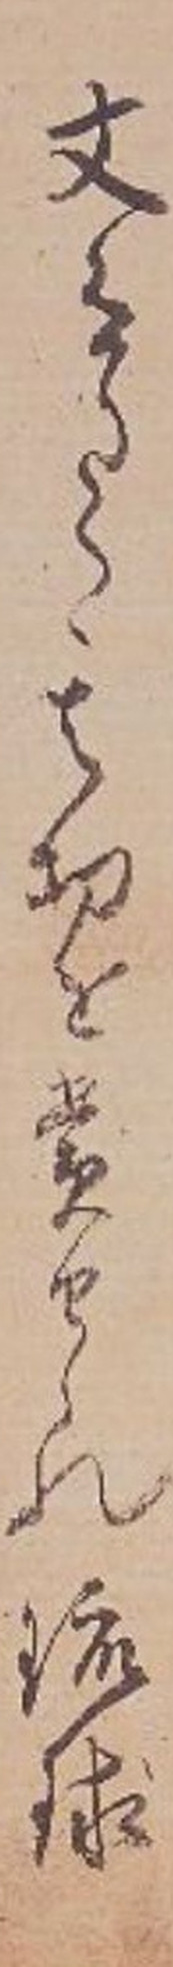文有りて其功を賞セられ琉球

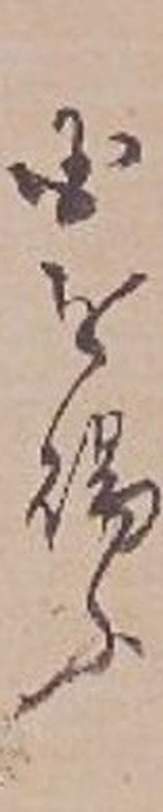国を賜ふ
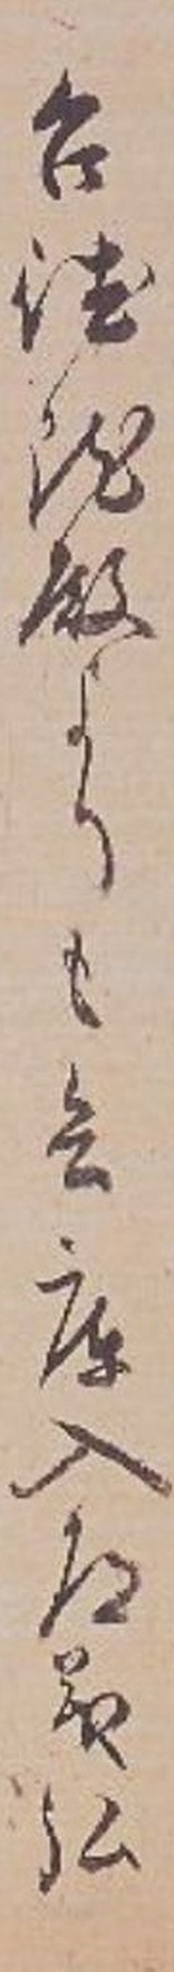台徳院殿よりも兵庫入道義弘
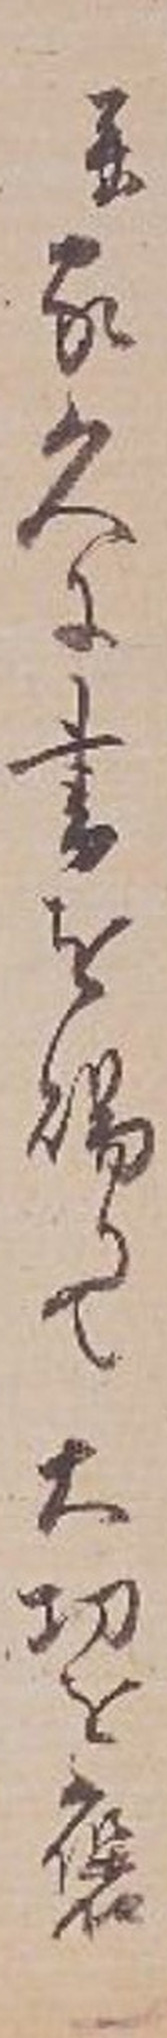並家久に書を賜りて大功を褒
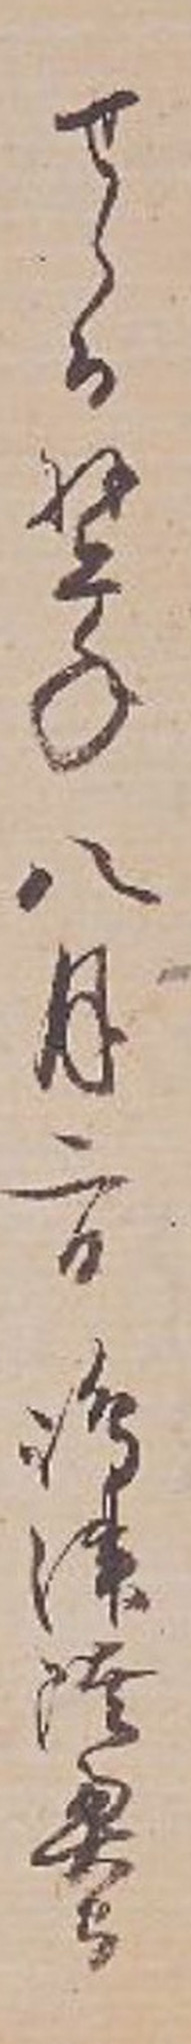せらる翌年八月二日嶋津陸奥守
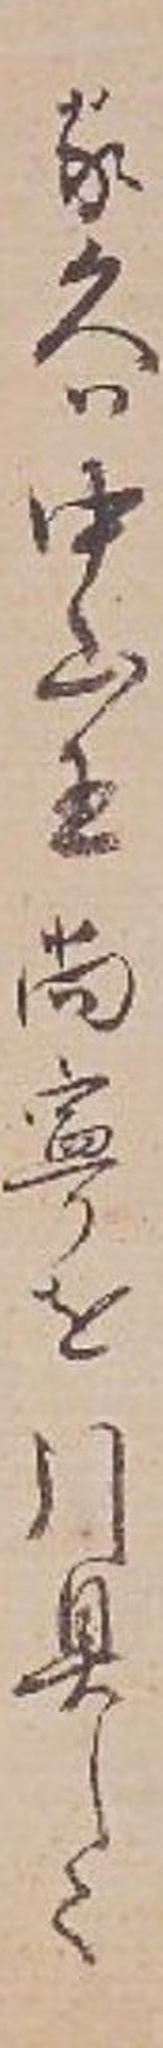家久ハ中山王尚寧を引具して
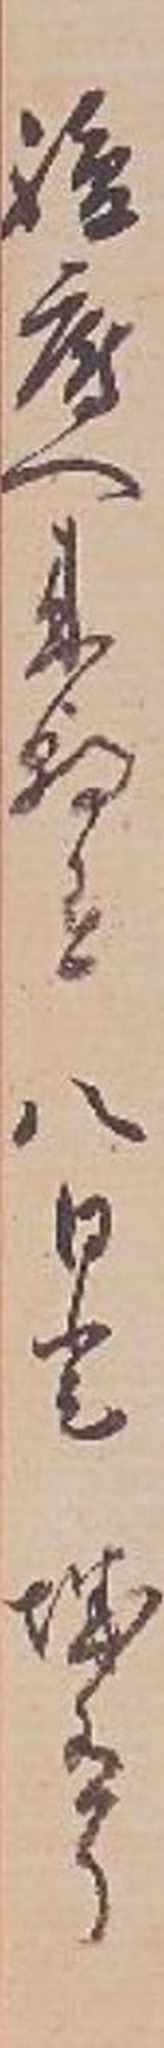駿府へ来朝す八日登城有り
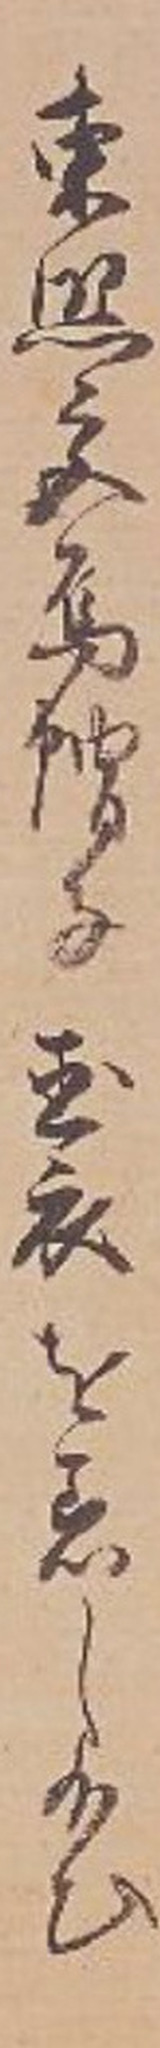東照宮烏帽子直衣を着し給ひ
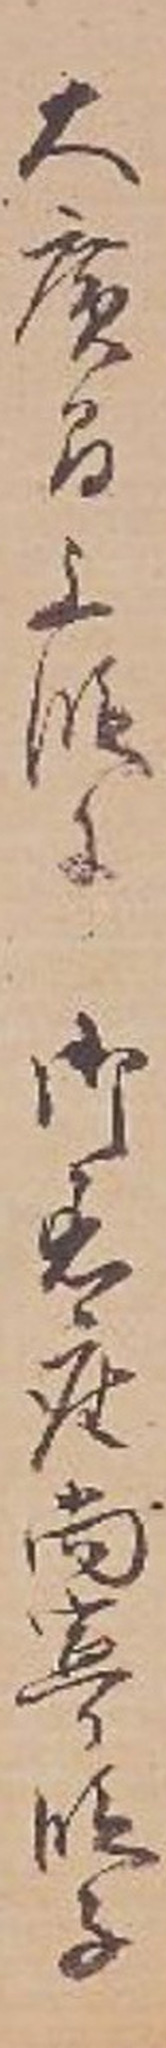大広間上段に御着座尚寧段子
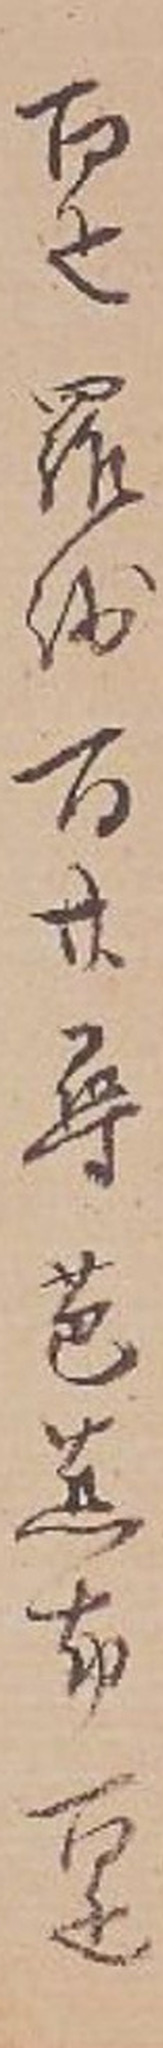百疋羅紗百廿尋芭蕉布百疋
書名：琉球人来朝記 一、二
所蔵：University of the Ryukyus Library
